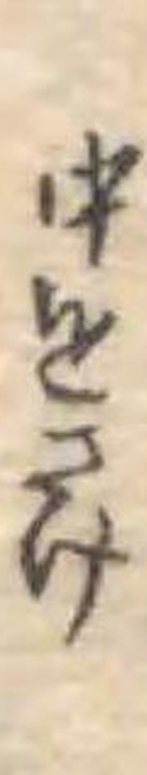中をさけ
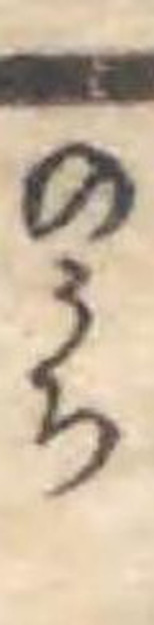のうち
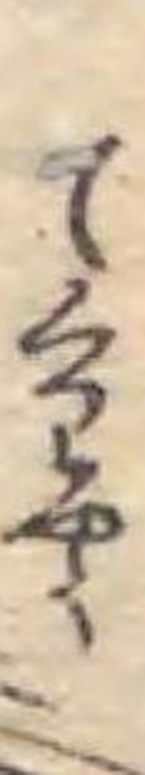てくりやう
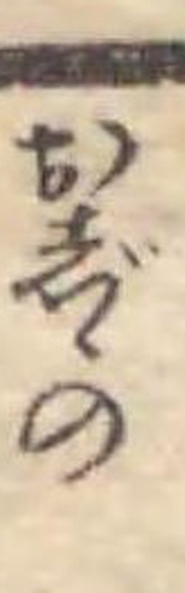おじゝの
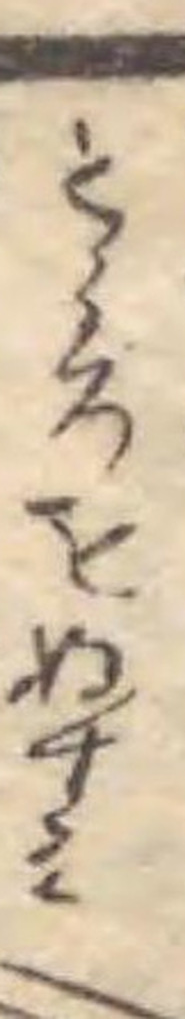こうろをぬすみ
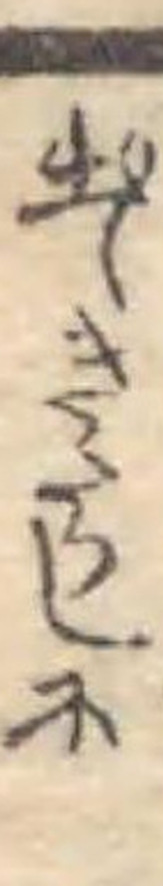出しきたりしに
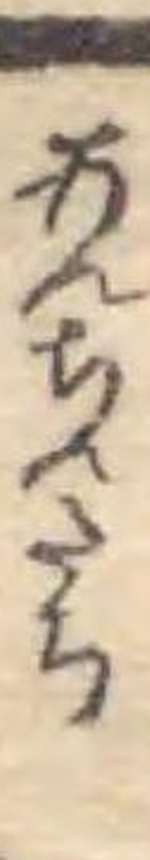あんちんたち
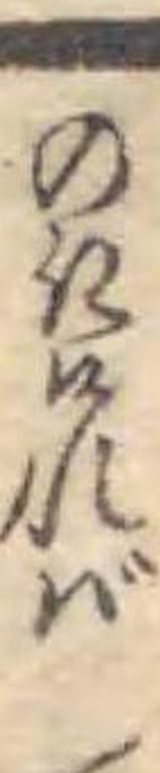のきければ
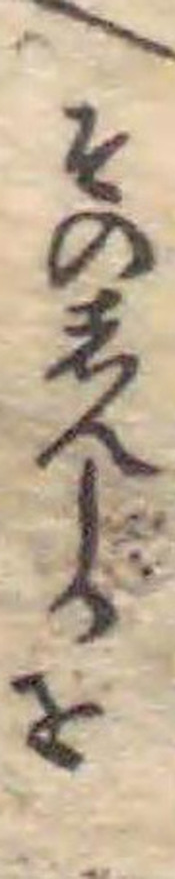そのしんじつを
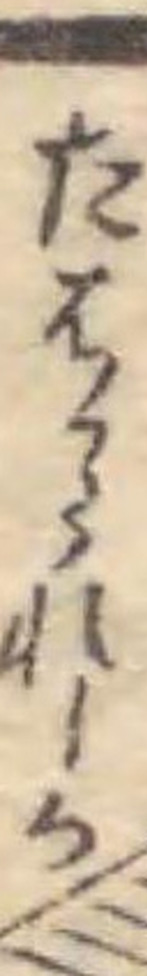たはかられしか
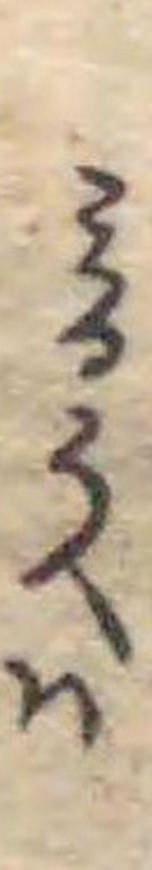みるうへは
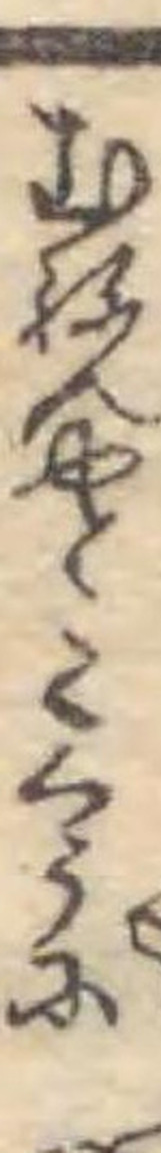むねんやとこくうに
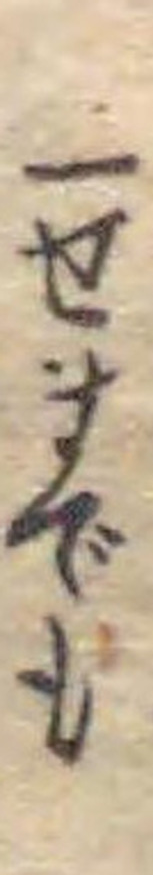二せまでも
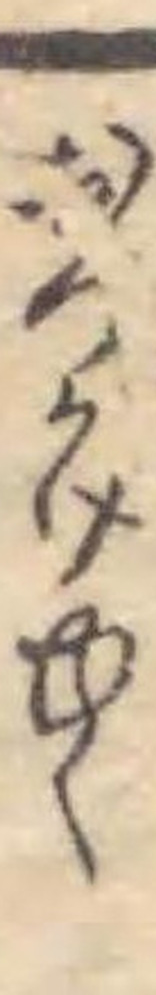おつかけゆく
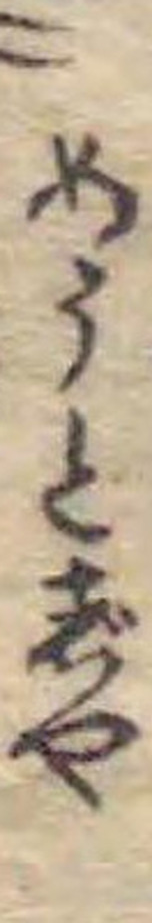めうとじや
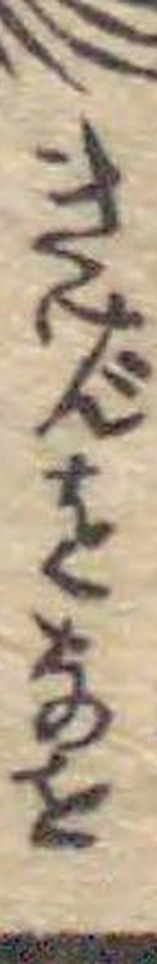きげんをなを
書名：鐘入七人化粧 : 3巻
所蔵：国立国会図書館 National Diet Library, JAPAN
